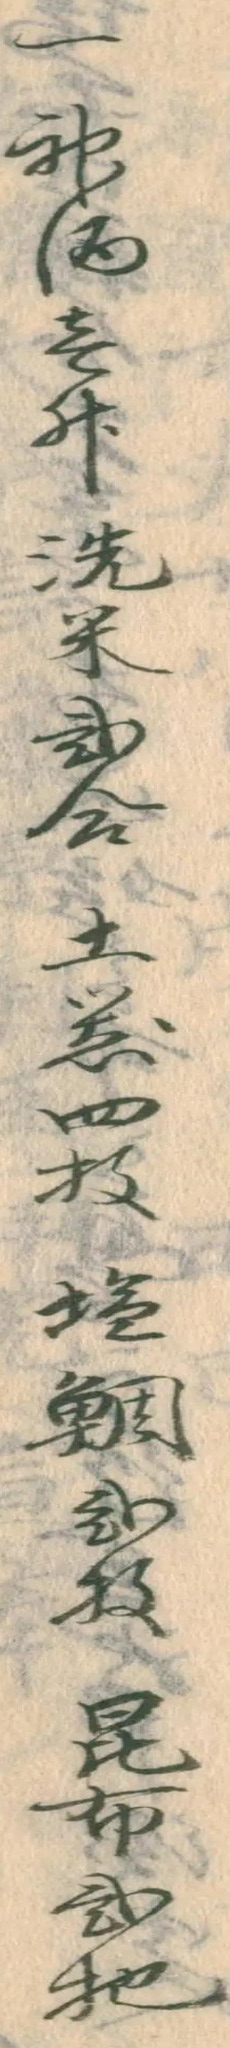一神酒壱升洗米弐合土器四枚塩鯛弐枚昆布弐把
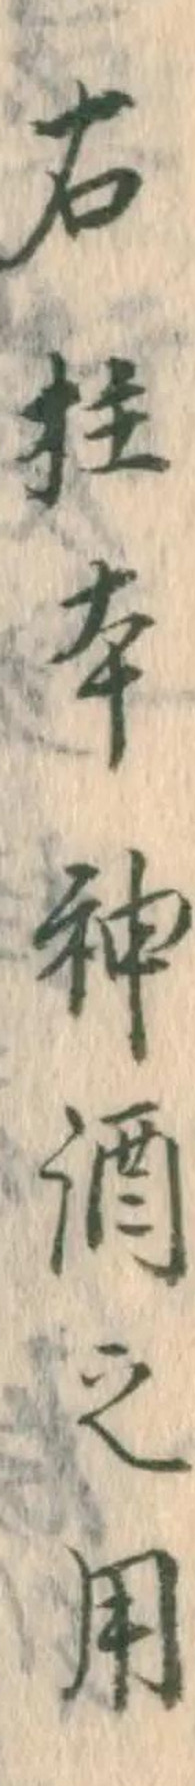右柱本神酒之用
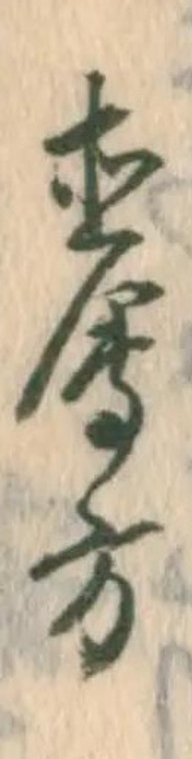直会方
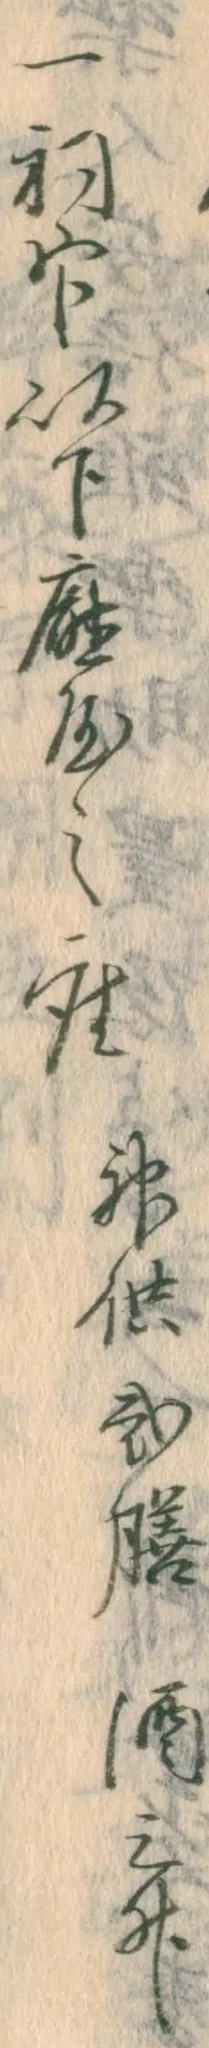一祠官以下庁屋之座神供弐膳酒三升
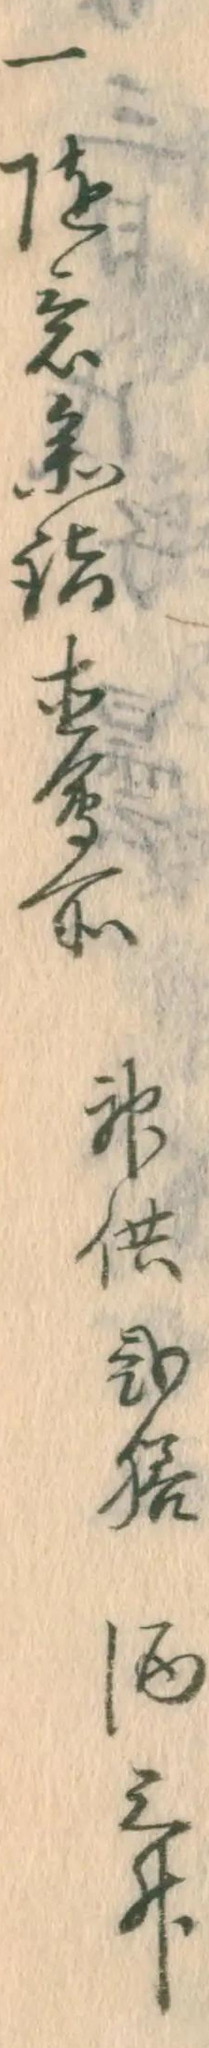一随意参詣直会所神供弐膳酒三升
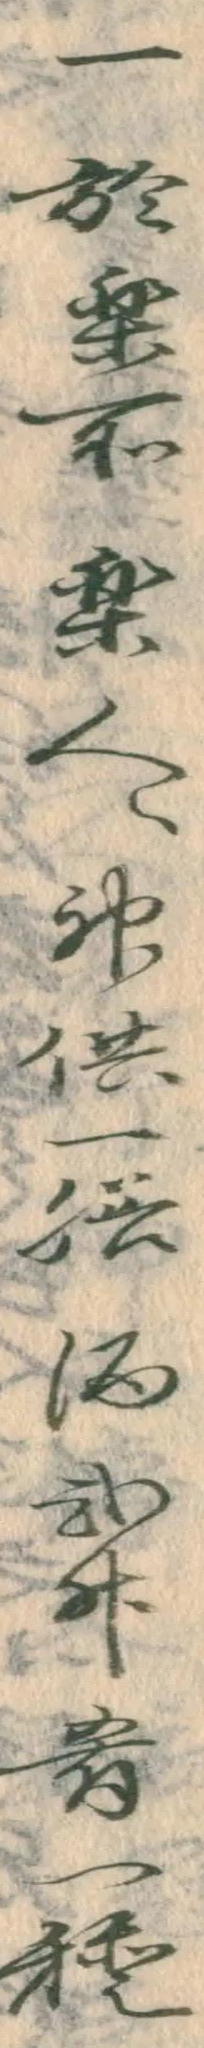一於楽所楽人へ神供一膳酒弐升肴一種
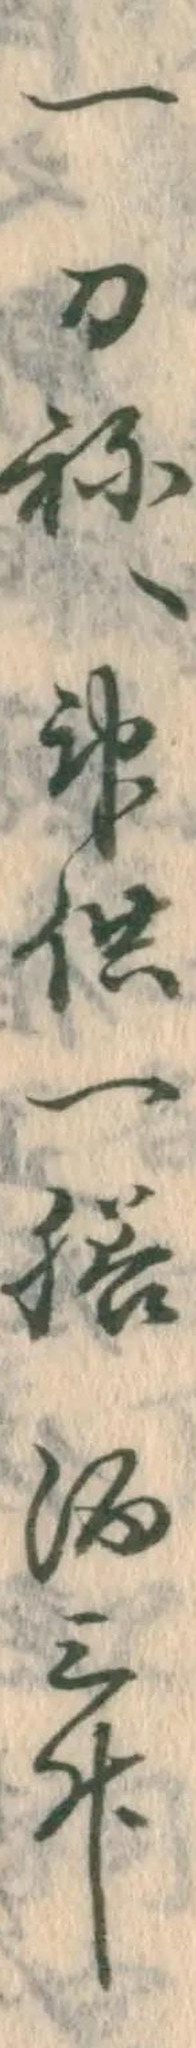一刀祢へ神供一膳酒三升
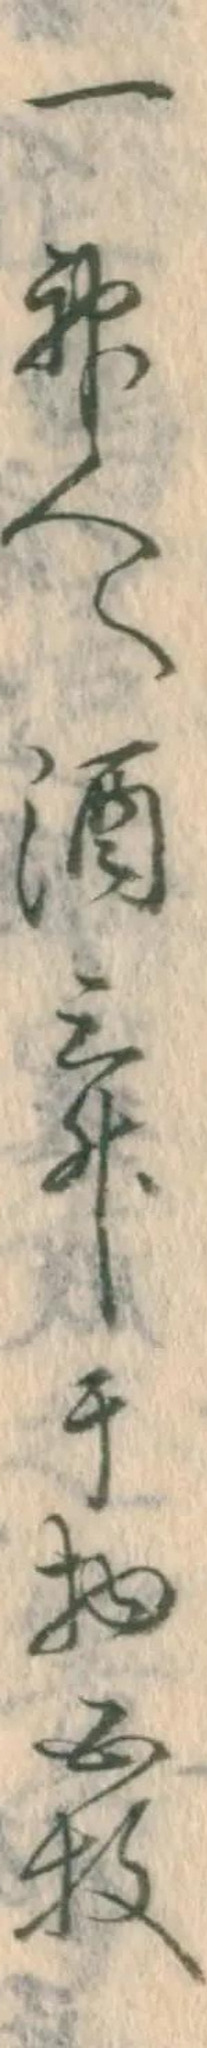一神人へ酒三升干物五枚
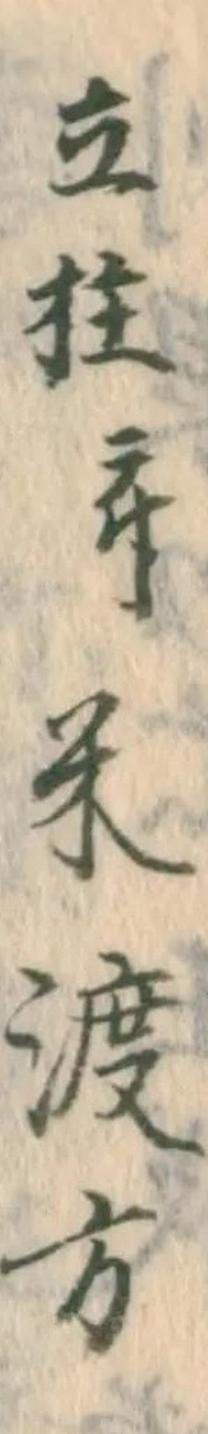立柱ニ付米渡方
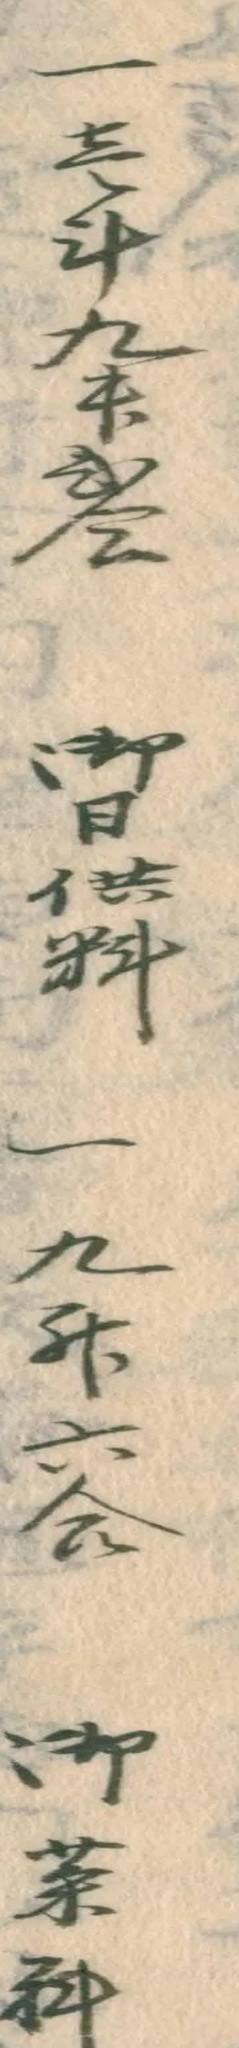一壱斗九升弐合御日供料一九升六合御菜料
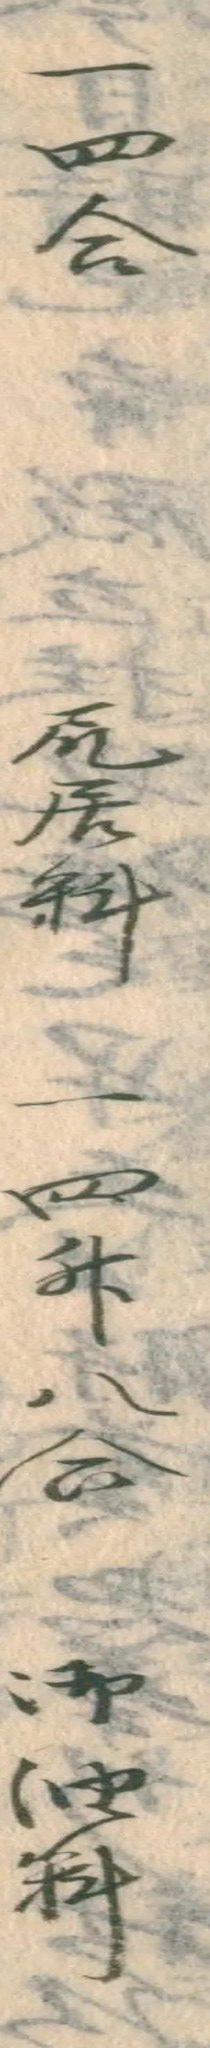一四合尻居料一四升八合御油料
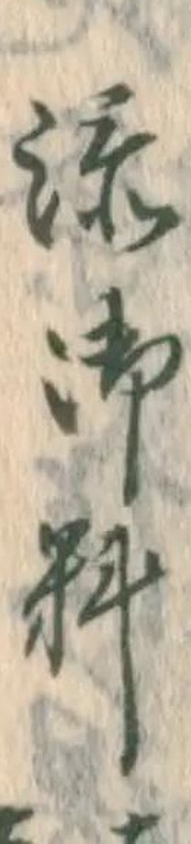漆御料
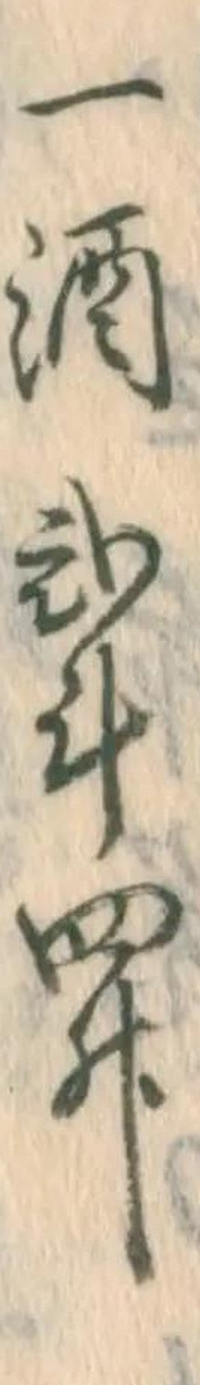一酒弐斗四升

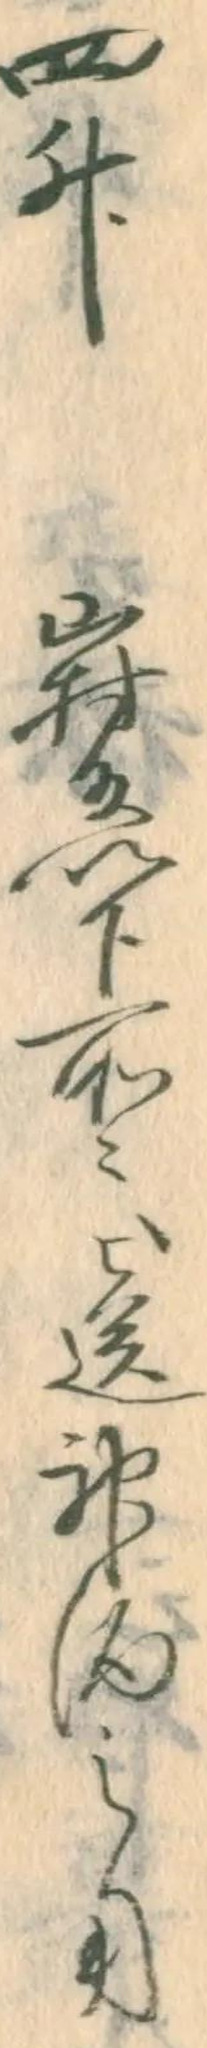四升山村殿以下所々へ被送神酒之用
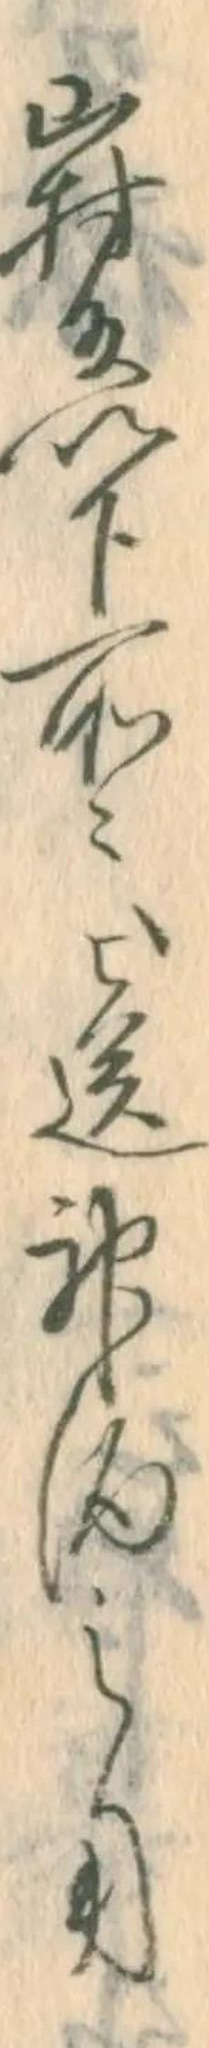四升山村殿以下所々へ被送神酒之用
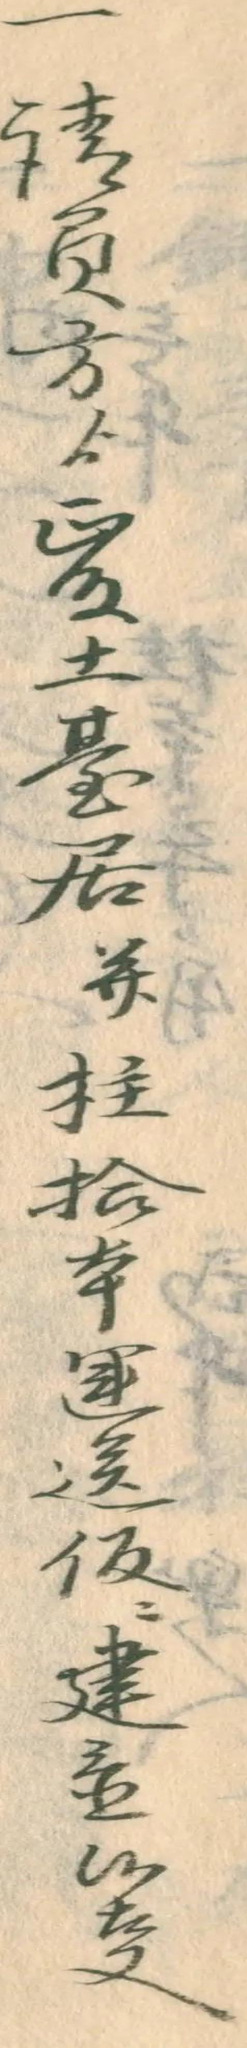一請負方ゟ正殿土台居并柱拾本運送仮ニ建置候事
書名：賀茂社記録. 第17冊
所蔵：国立国会図書館 National Diet Library, JAPAN
